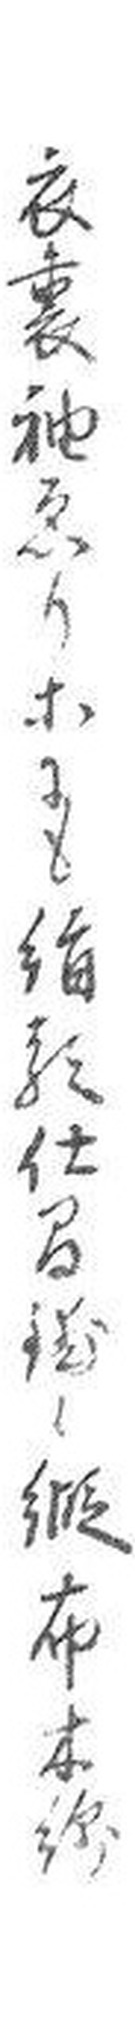衣裏袖えり等にも絹類仕間鋪候縦布木綿
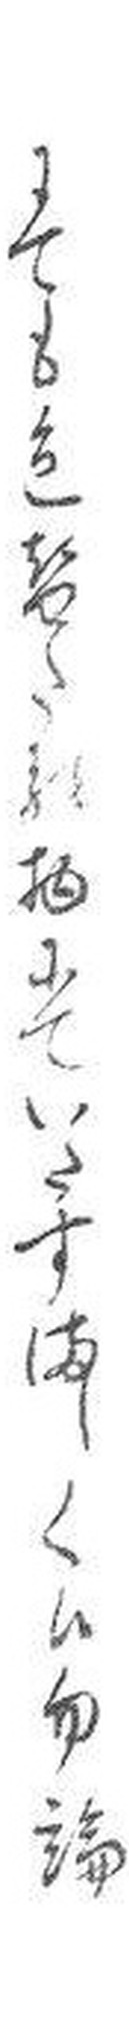にても色替たる物にていたすましく候勿論
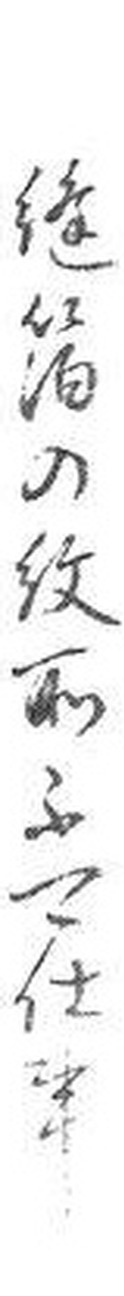縫箔の紋所不可仕事
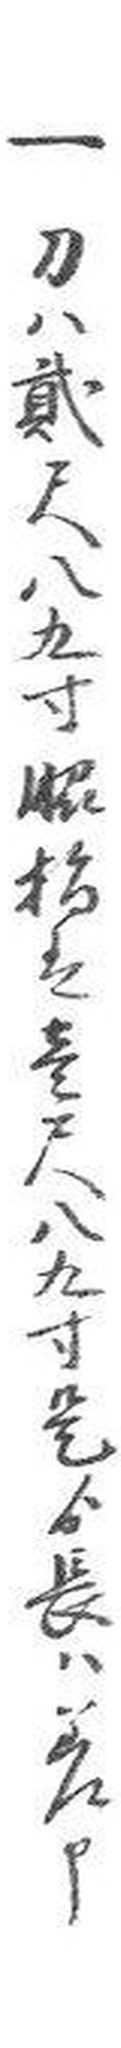一刀ㇵ弐尺八九寸脇差は壱尺八九寸是ゟ長ㇵ差申
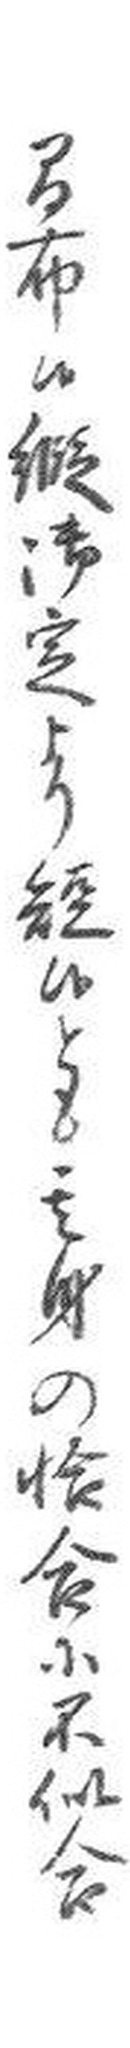間布候縦御定より短候とも其身の恰合に不似合
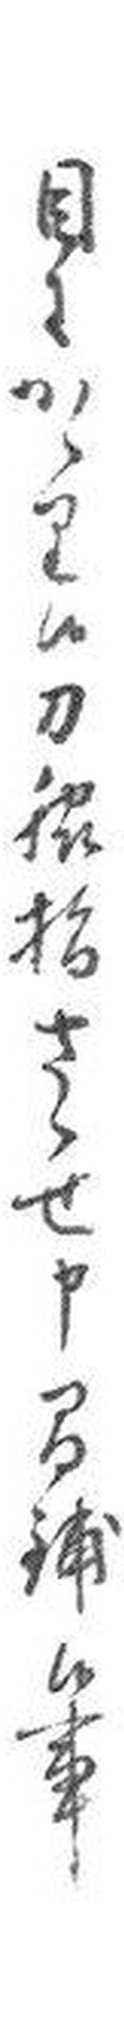目にかかり候刀脇差さゝせ申間鋪候事
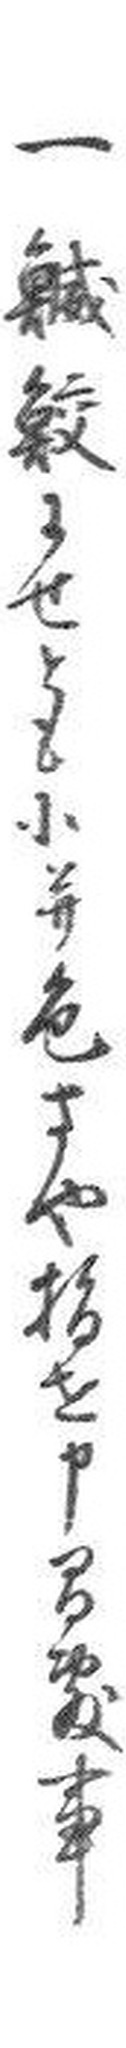一鰄鮫にせともに并色さや指せ申間敷候事
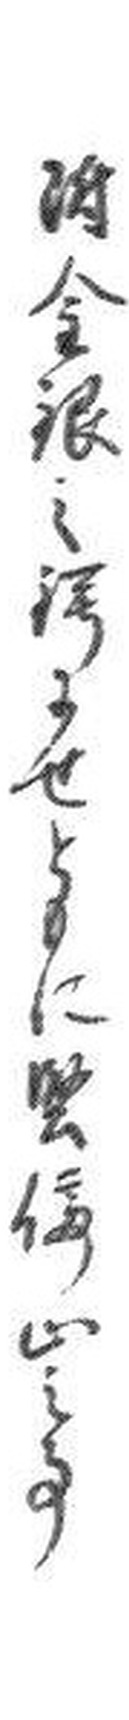附金銀の鍔にせともに堅停止之事
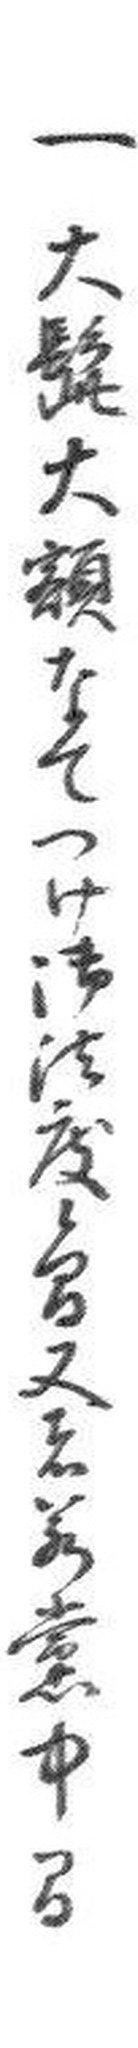一大髭大額なてつけ御法度候間又者若党中間
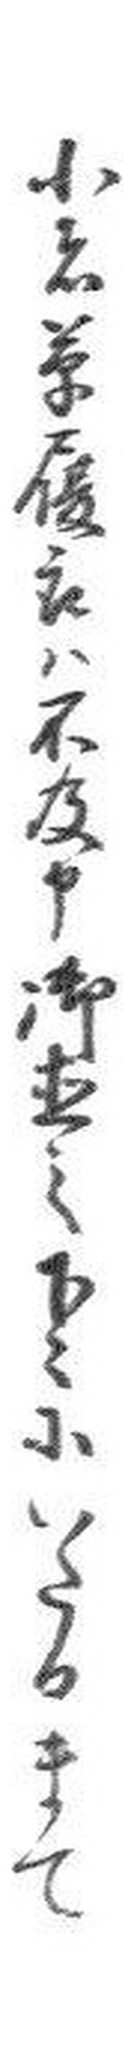小者草履取ㇵ不及申御直之下々にいたるまて
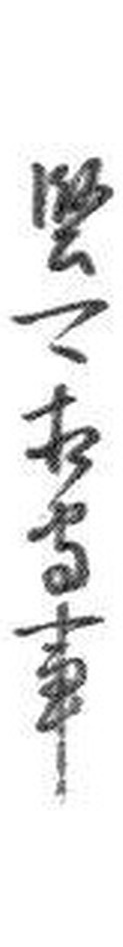堅可相守事
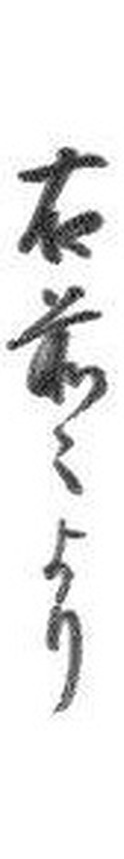右前々より
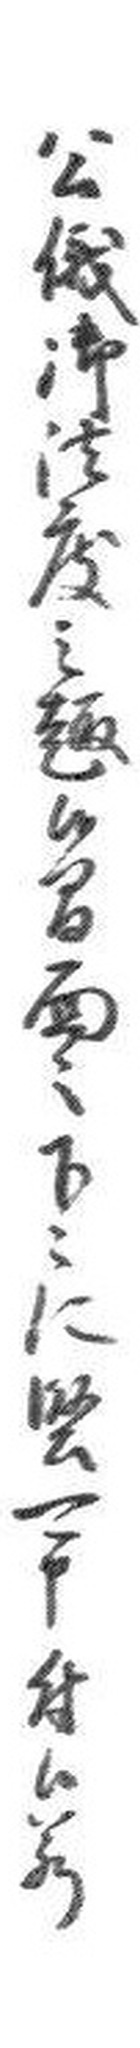公儀御法度之趣候間面々下々に堅可申付候若
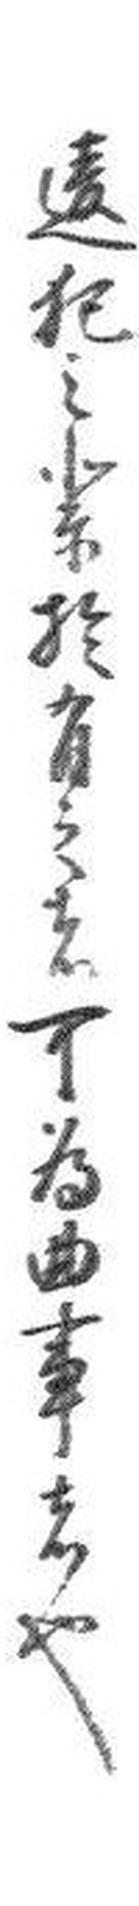違犯之輩於有之者可為曲事者也
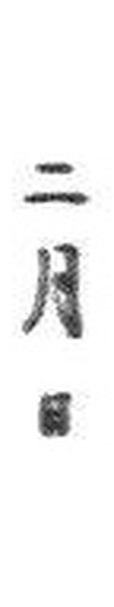二月日

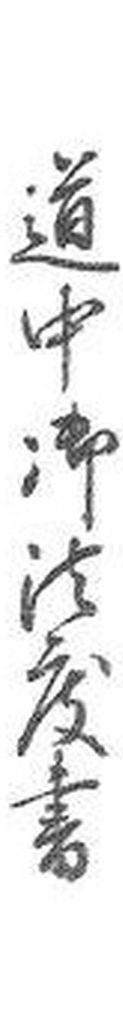道中御法度書
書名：家譜 五 光通公 従寛永十三年到万治二年
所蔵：福井県文書館 Fukui Prefectural Archives
